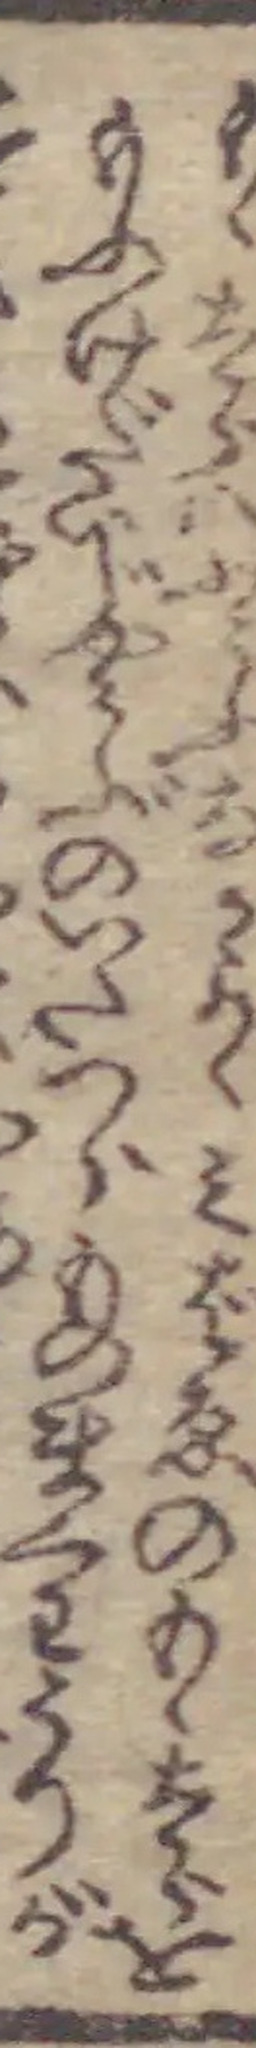もふけだいじやうぶのいたつらものまくわうりが
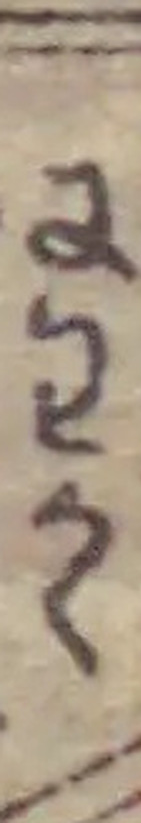にわかく
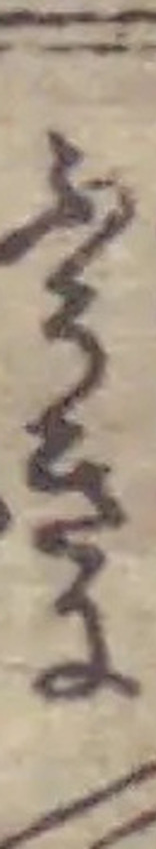ふうきに
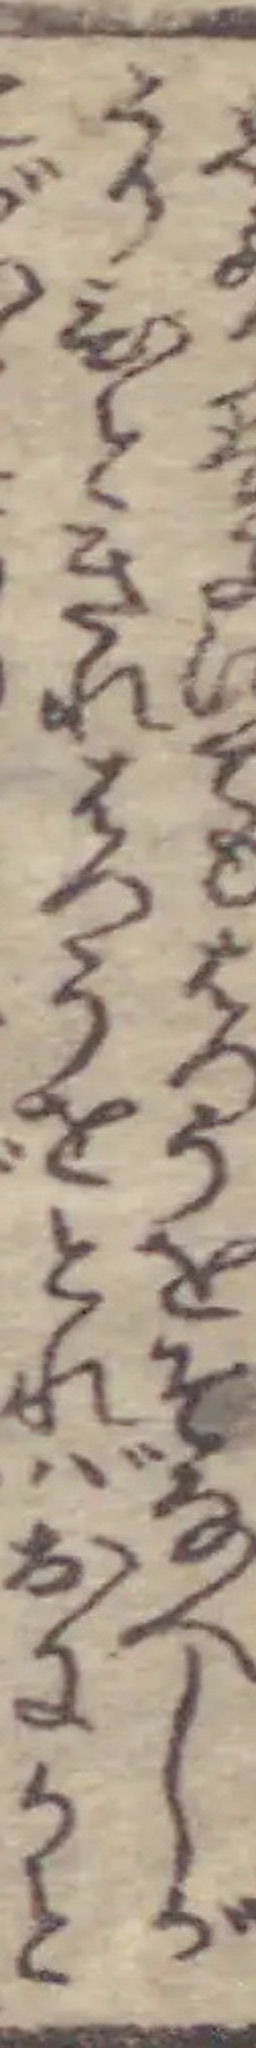うりひときれはつうをとればおにかと
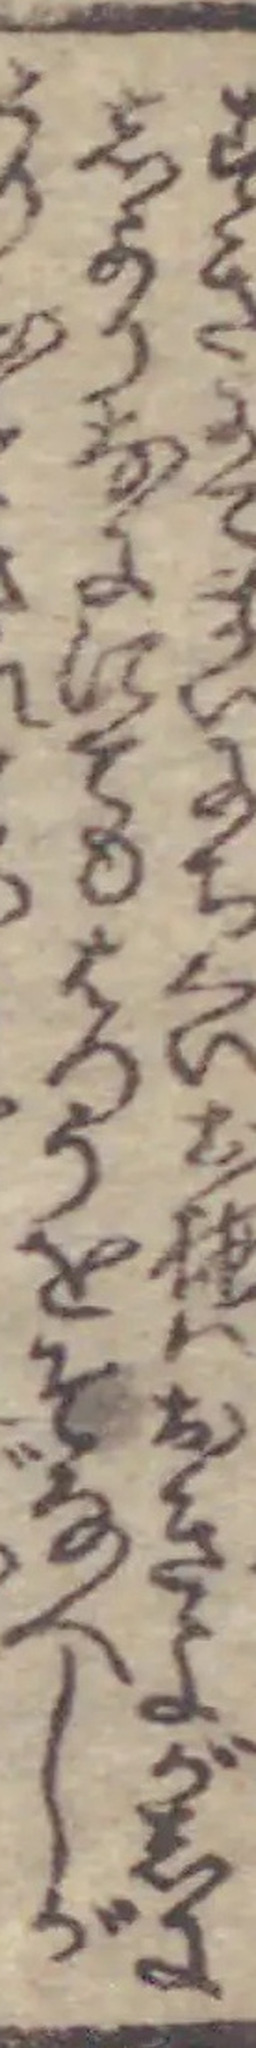しよりなににてもはつうをそなへしが
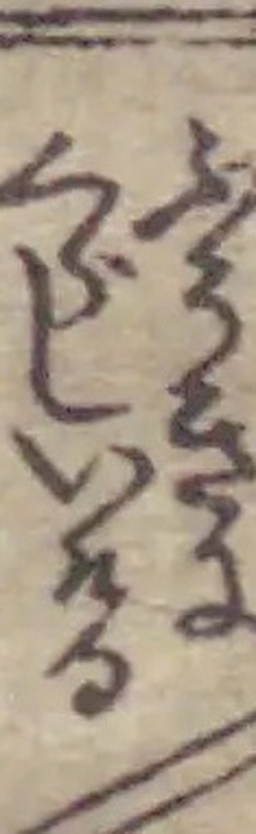くらしいける
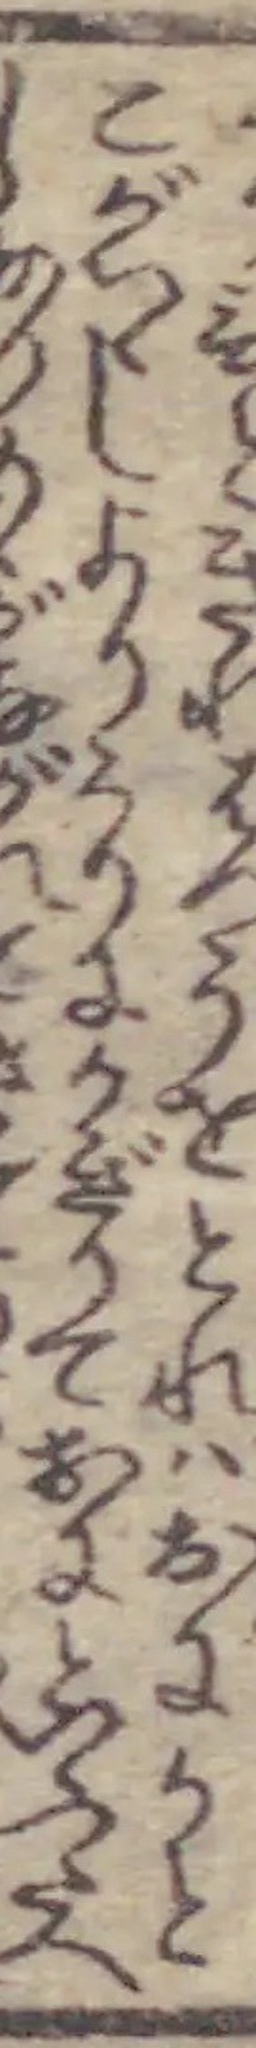こがいゝしよりうりにかぎりておにといゝつたへ
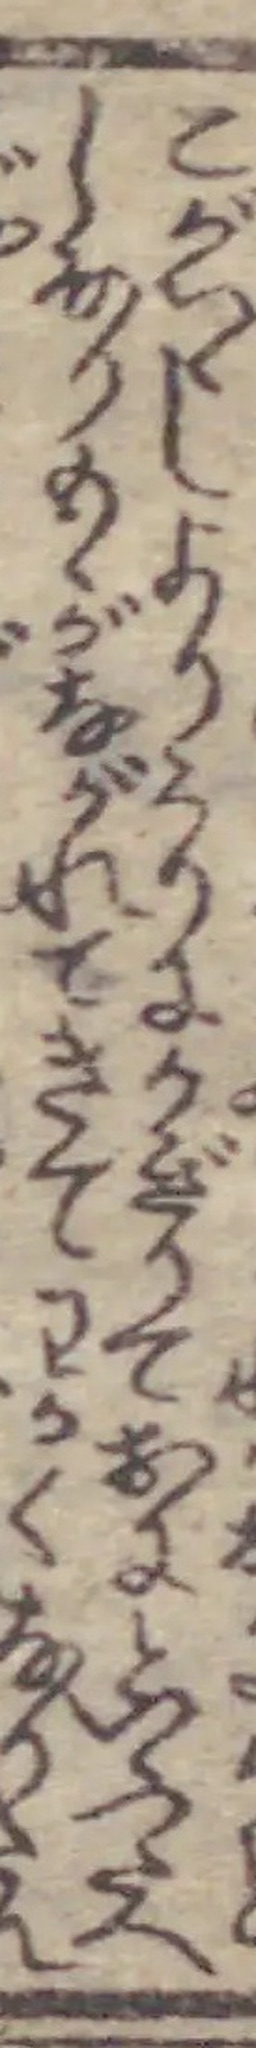しなりもゝがながれてきてわかくなりたん
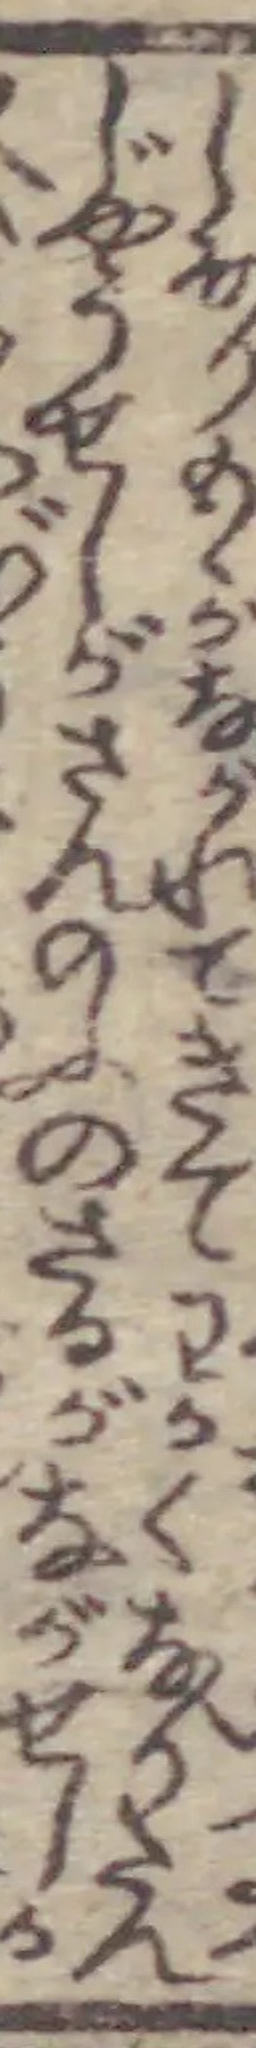じやうせしがさんのふのさるがながせしか
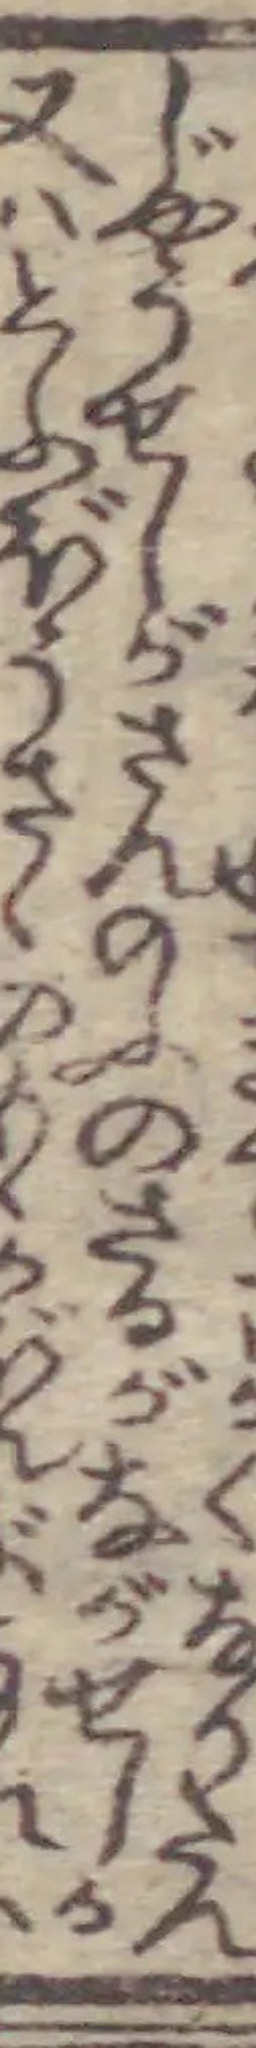又はとふぼうさくのもゝかぼんぶなれは
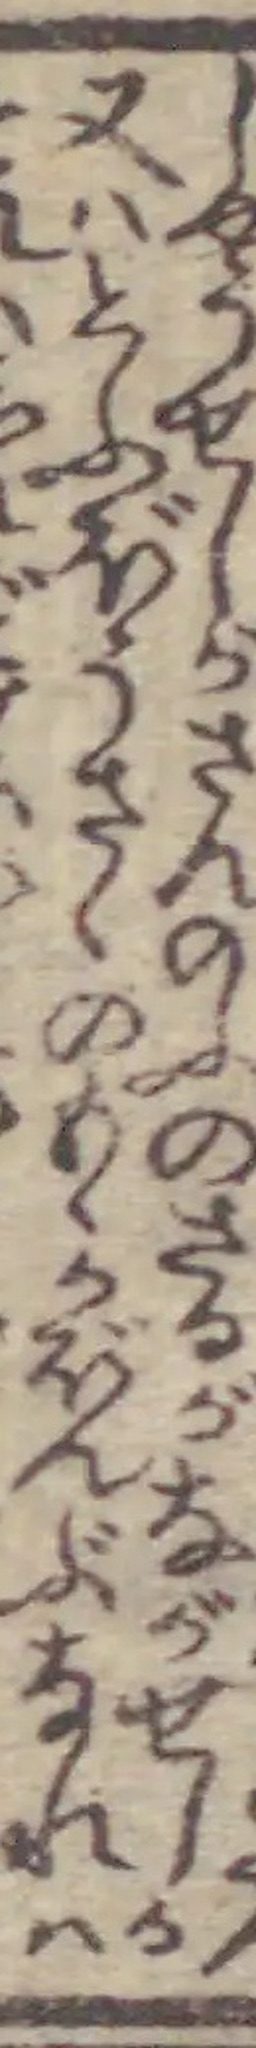又はとふぼうさくのもゝかぼんぶなれは
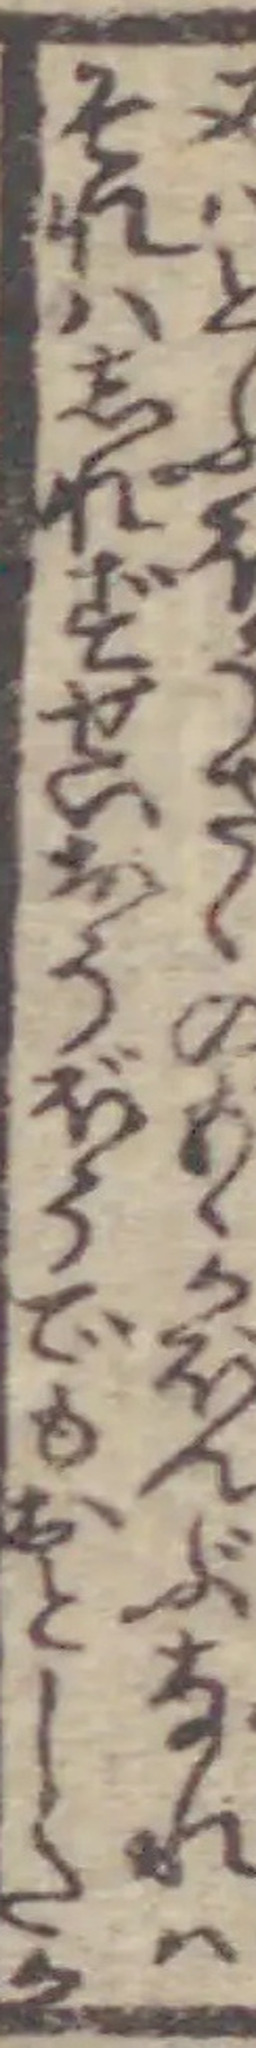それはしれずせいおうぼうでもおとしたか
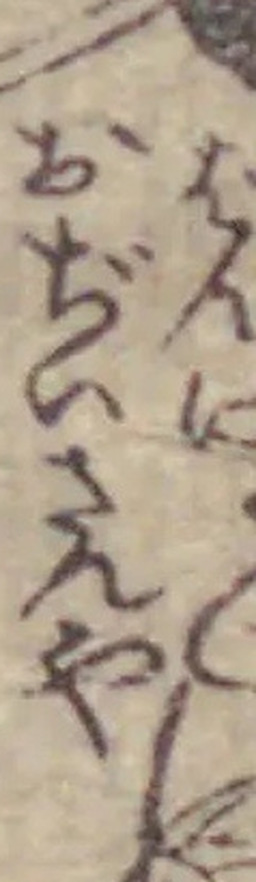おぢいさんや
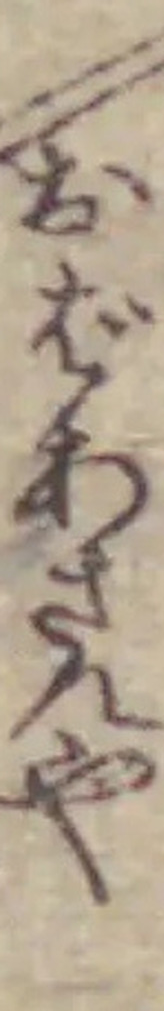おばあさんや
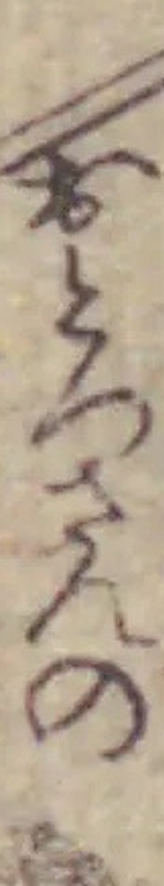おとつさんの
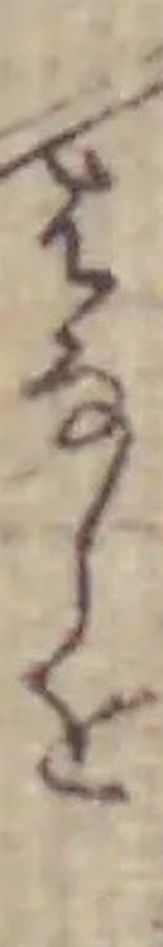はなしを
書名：桃太郎元服姿 2巻
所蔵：国立国会図書館 National Diet Library, JAPAN
